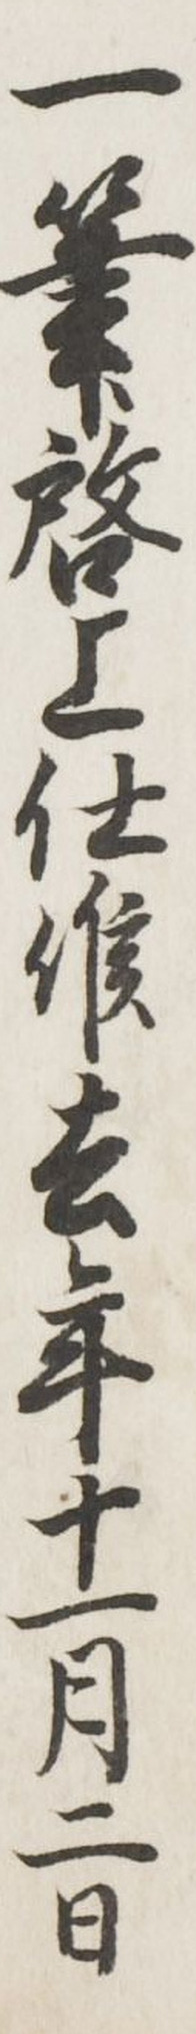一筆啓上仕候去年十一月二日
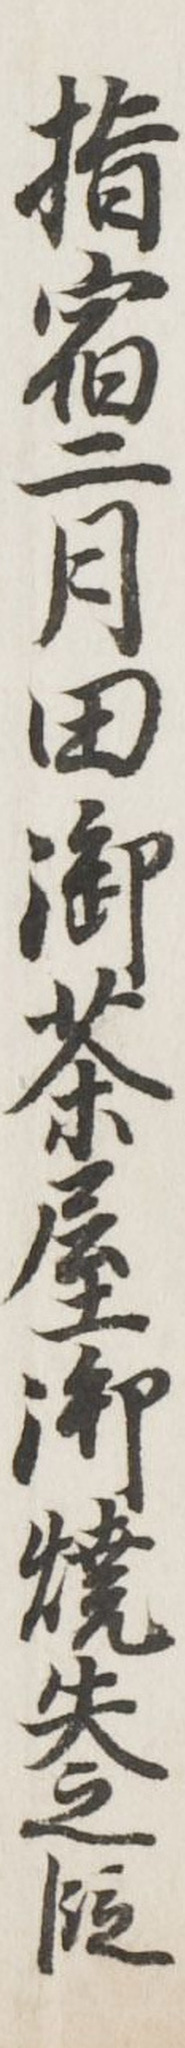指宿二月田御茶屋御焼失之段
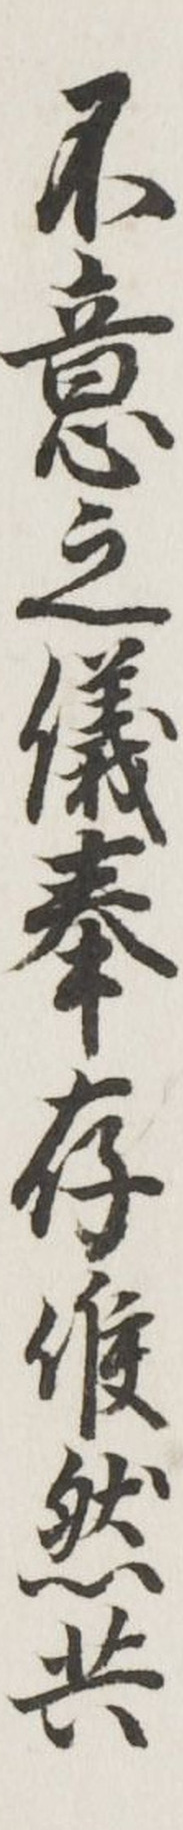不意之儀奉存候然共
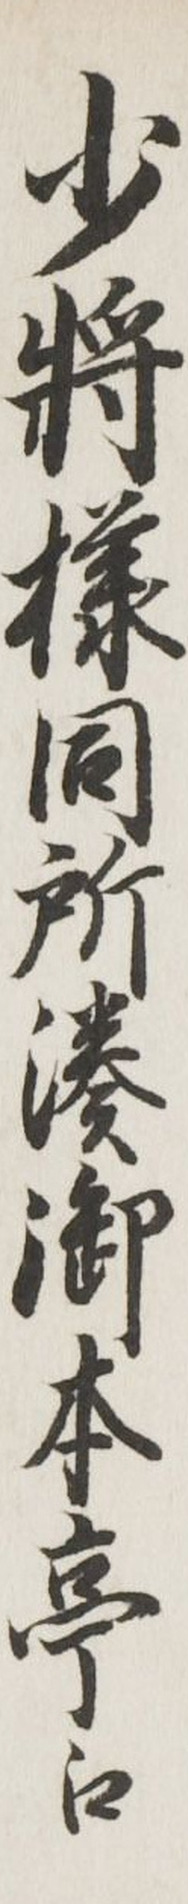少将様同所湊御本亭江
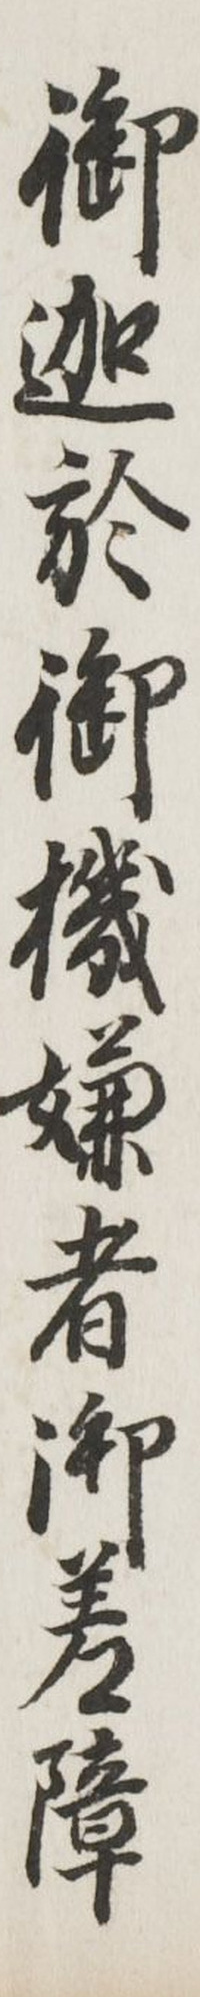御迦於御機嫌者御差障
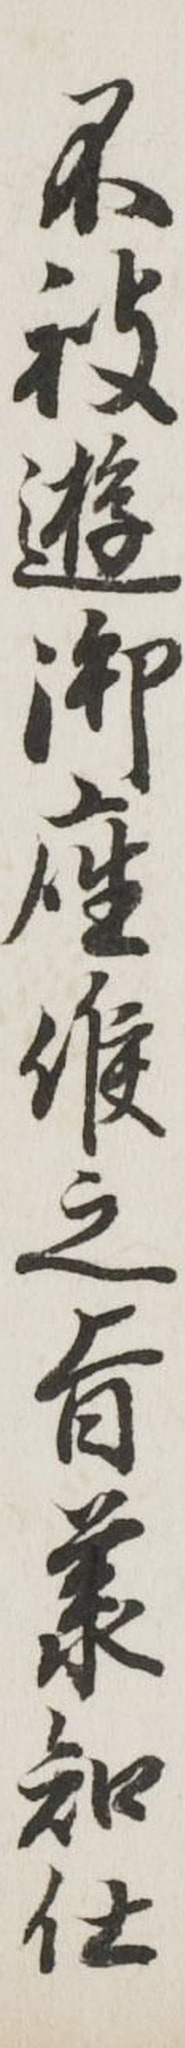不被遊御座候之旨承知仕
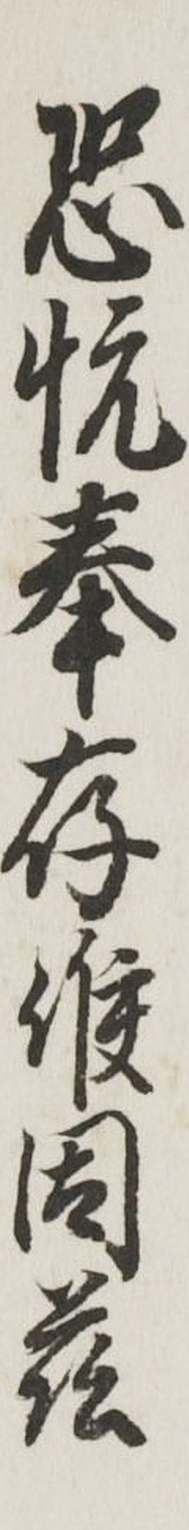恐悦奉存候因茲
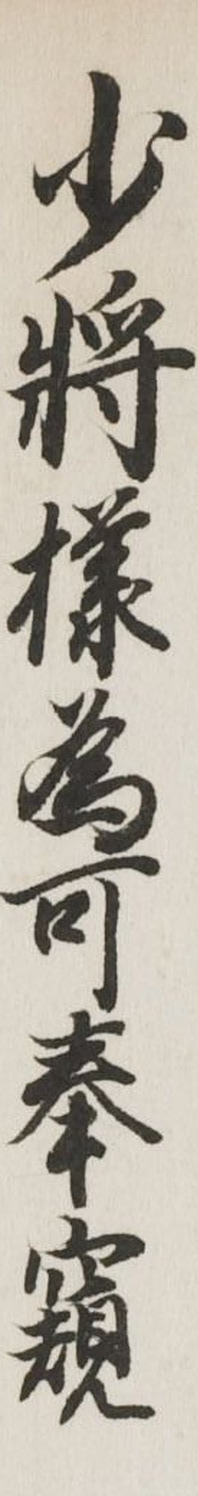少将様為可奉窺
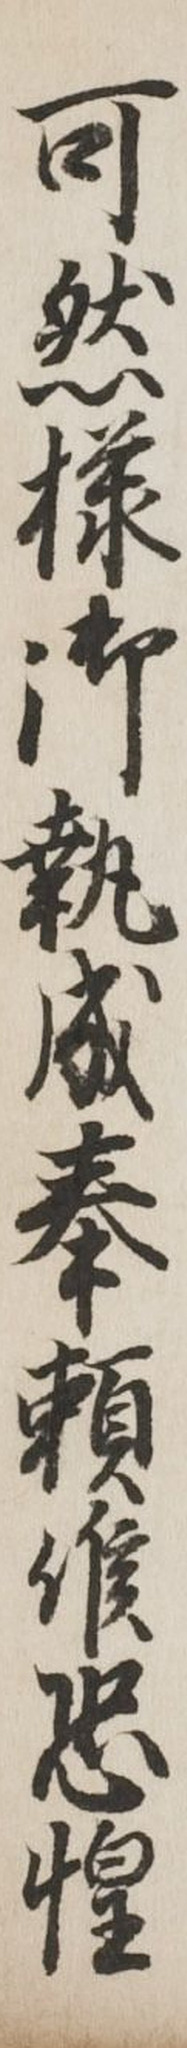可然様御執成奉頼候恐惶
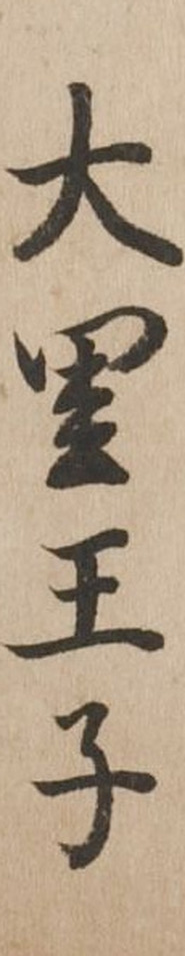大里王子
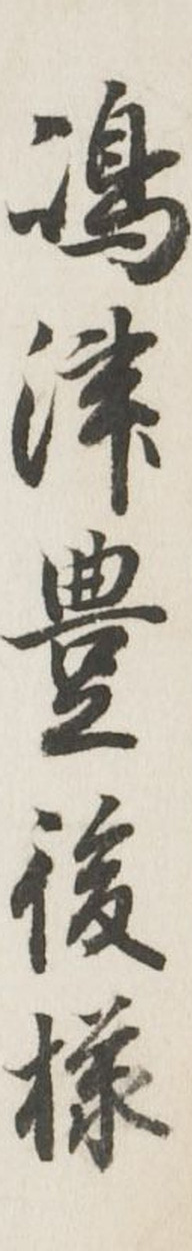嶋津豊後様
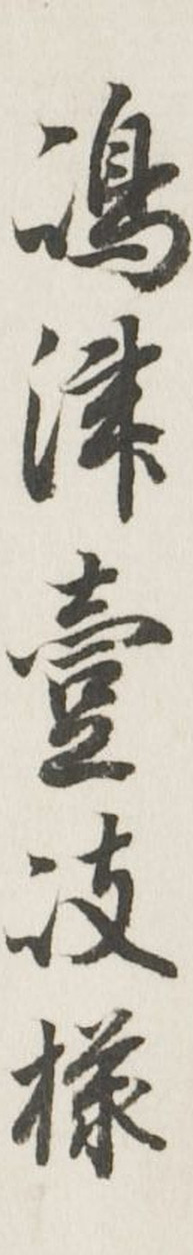嶋津壱岐様
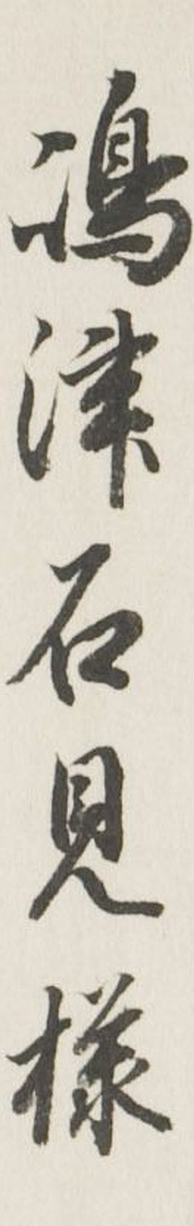嶋津石見様
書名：琉球王府花押印状 大里王子朝教 四月十六日
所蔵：University of the Ryukyus Library
